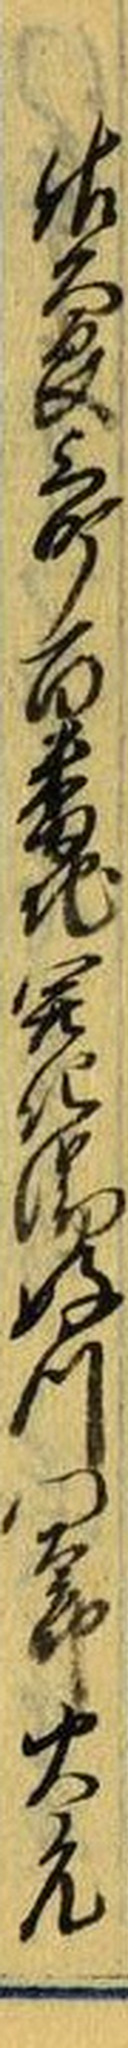佐久良上町百番地開化場好川門太郎火元
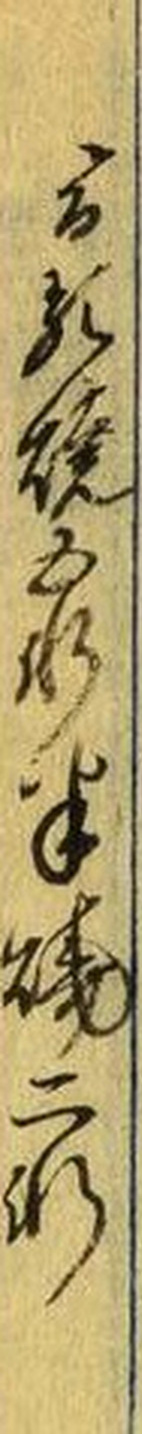に而類焼五軒半焼二軒
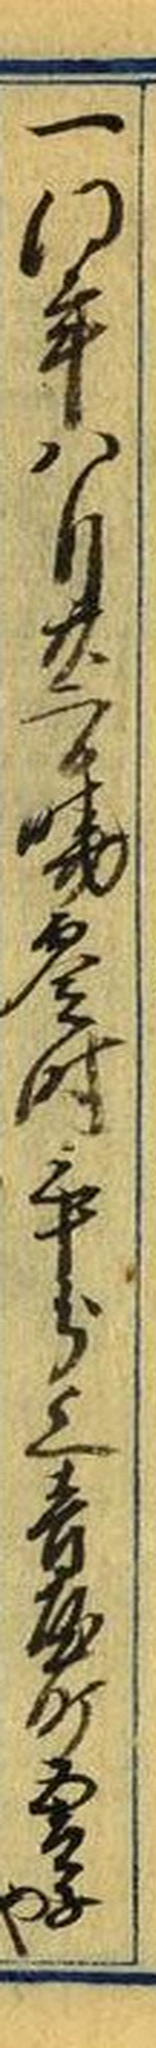一同年八月廿二日暁参時三十分ゟ上青屋町五青子や
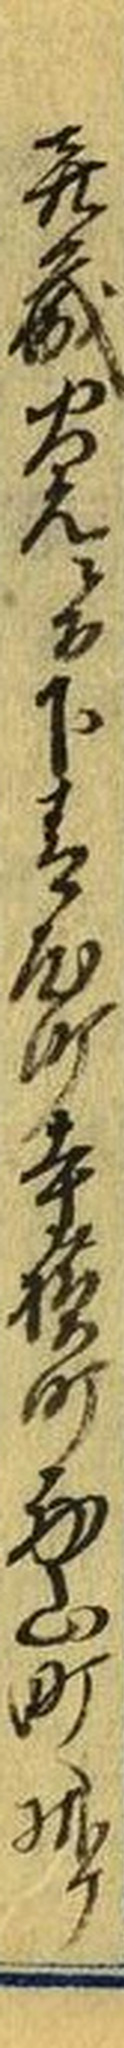喜蔵火元に而下青屋町寺横町舟山町掛け
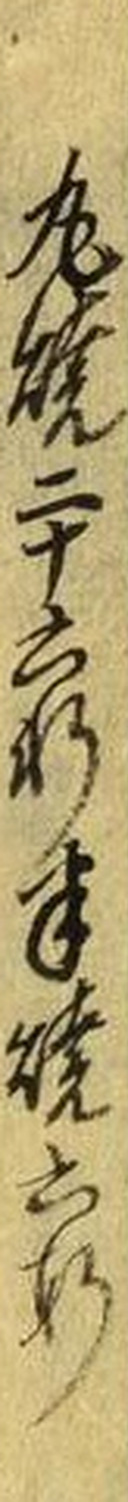丸焼二十六軒半焼六軒
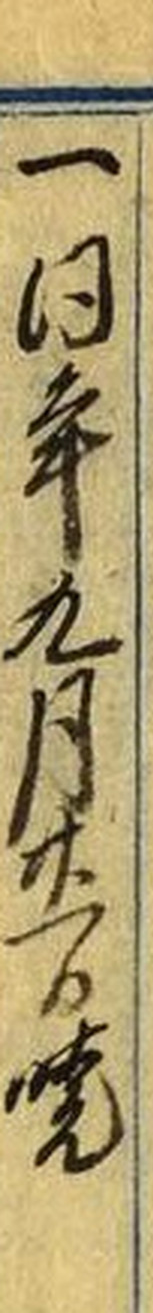一同年九月廿一日暁
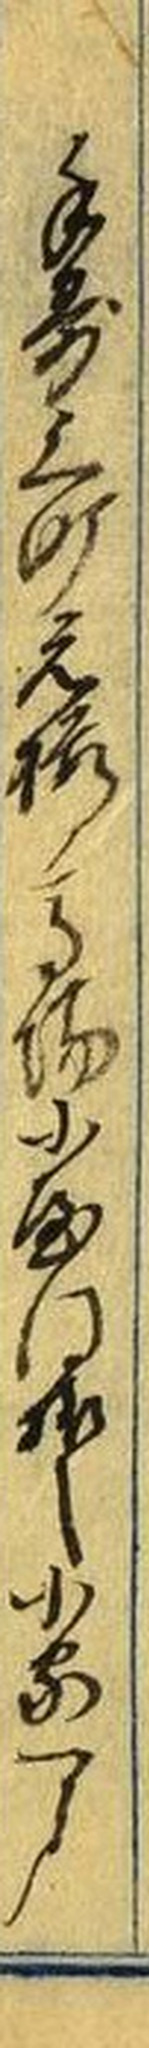手寄上町元桜之馬場小屋門様之小家一戸
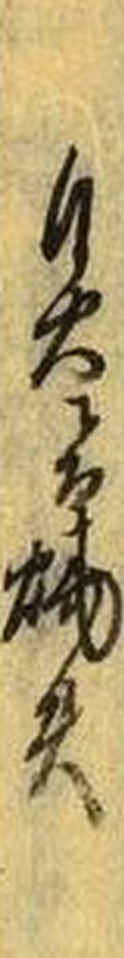自火に而焼失

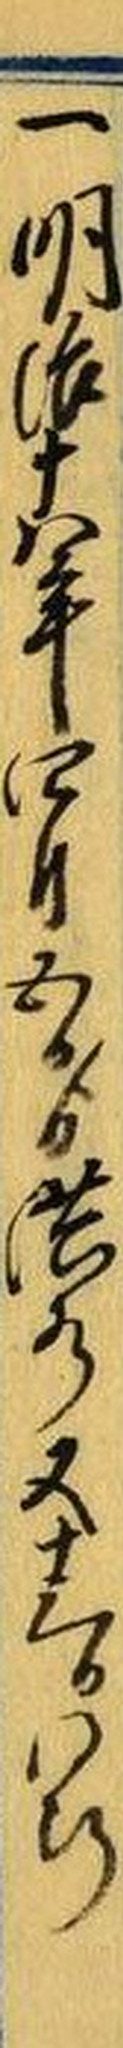一明治十八年四月五日ゟ洪水又十三日同断
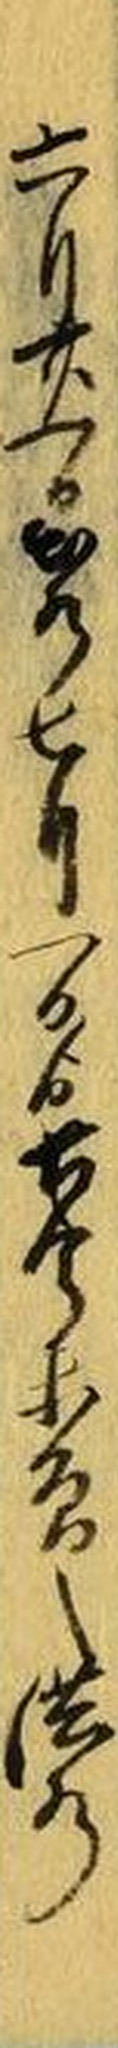六月廿一日出水七月一日ゟ古今未曾之洪水
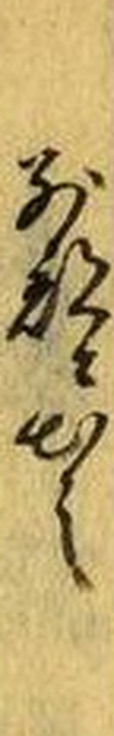別部に出之
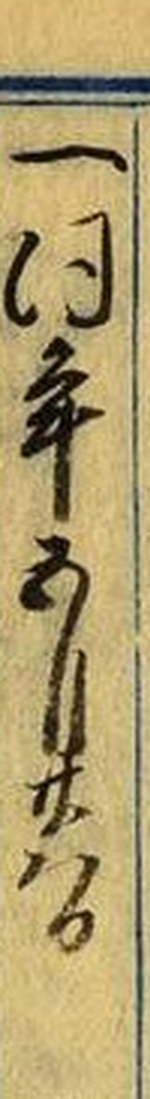一同年五月廿八日
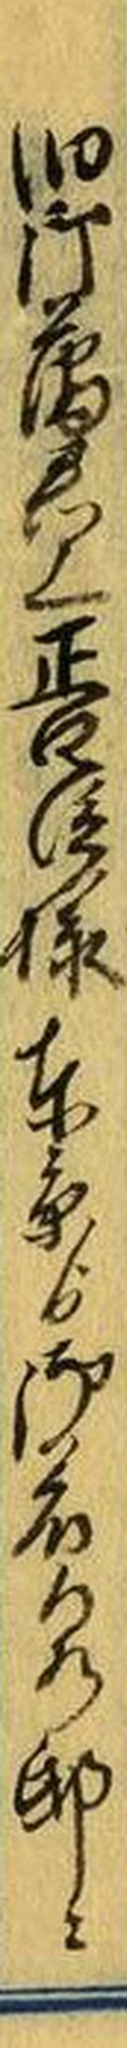旧御藩君上正四位様東京ゟ御着泉邸に
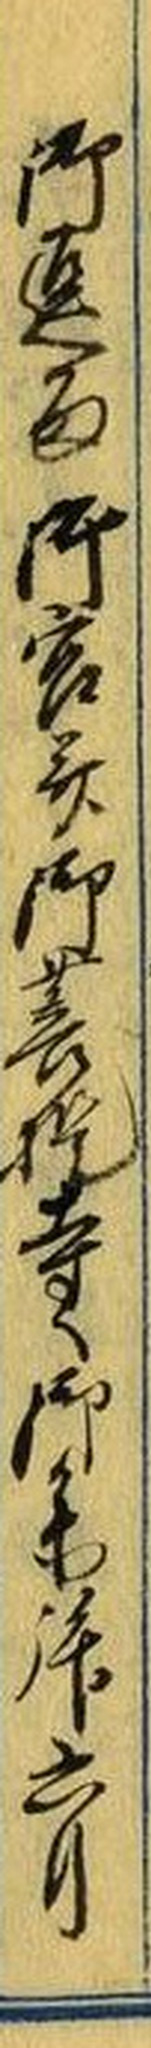御逗留御宮并御菩提寺へ御参拝六月
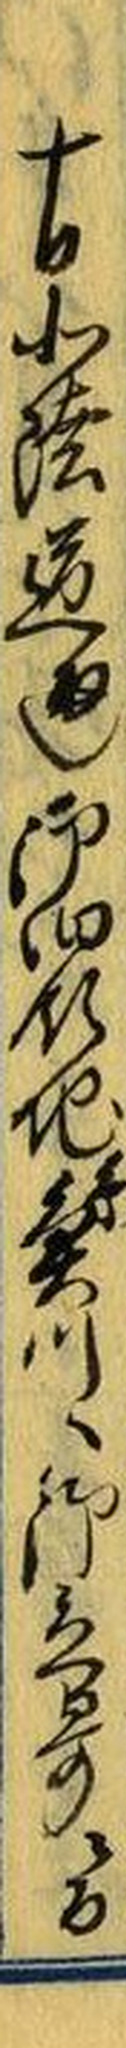十日北陸道通御旧領地糸魚川へ御立寄に而
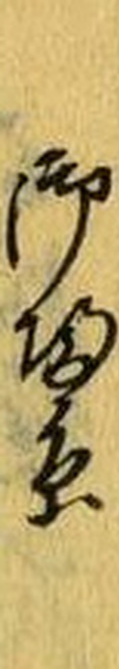御帰京
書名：温古集 五巻
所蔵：福井県文書館 Fukui Prefectural Archives
